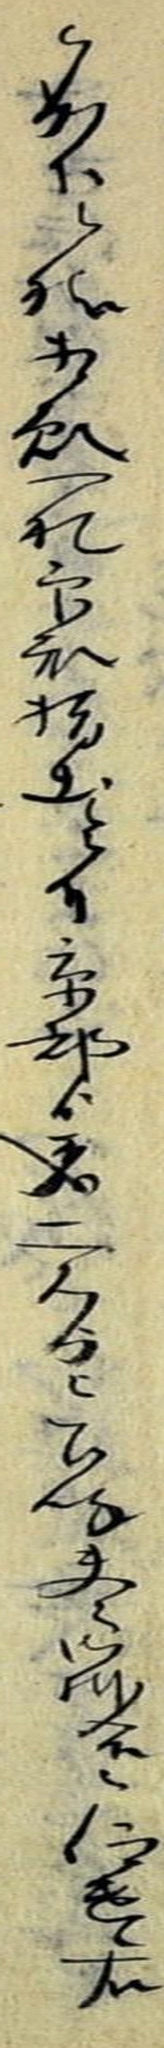被成下候様相願一札印形指出候に付京都ゟ森二右衛門被召呼夫々御掛合被仰遣候右
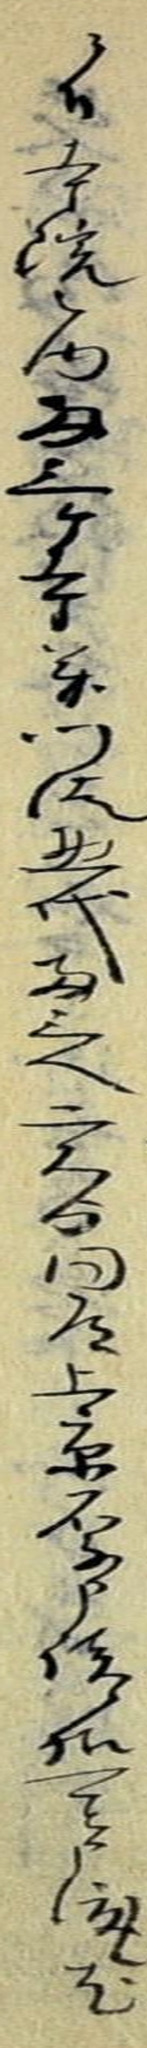に付寺院之内両三ヶ寺并門徒惣代両三人二右衛門同道上京厚申談候様可被申渡候尤
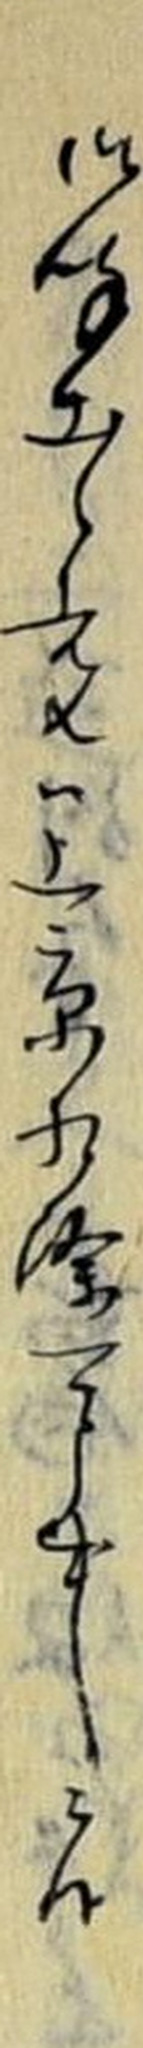御呼出之者共は上京相除可申事に候
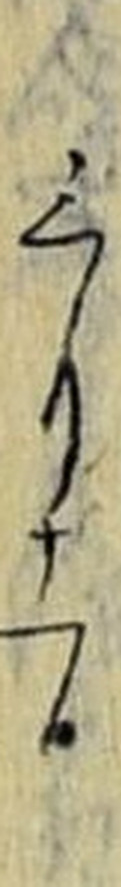三月十一日
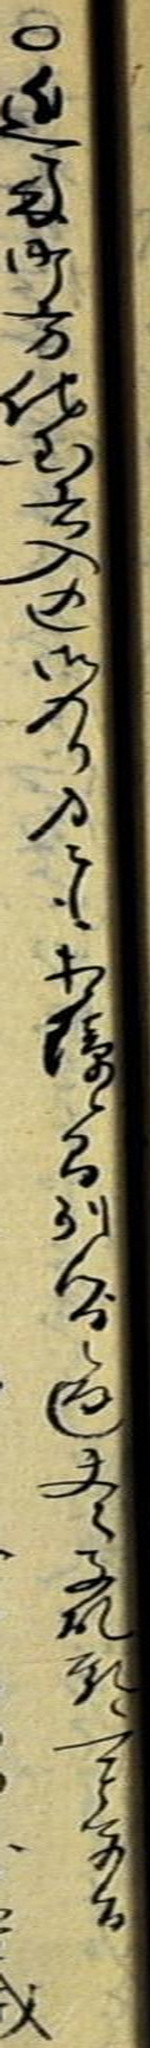○近来御方他国者入込御〆り方にも相障り候間別紙之通夫々支配頭へ可申聞旨
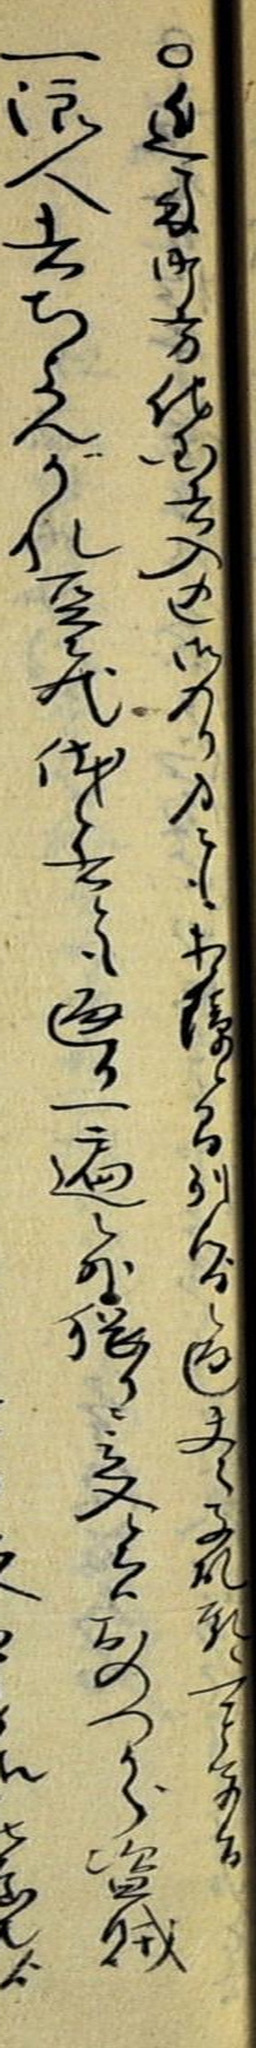一浪人者ちよんがれ豆蔵体之者へも通り一遍之外猥りに立入候而はおのつから盗賊
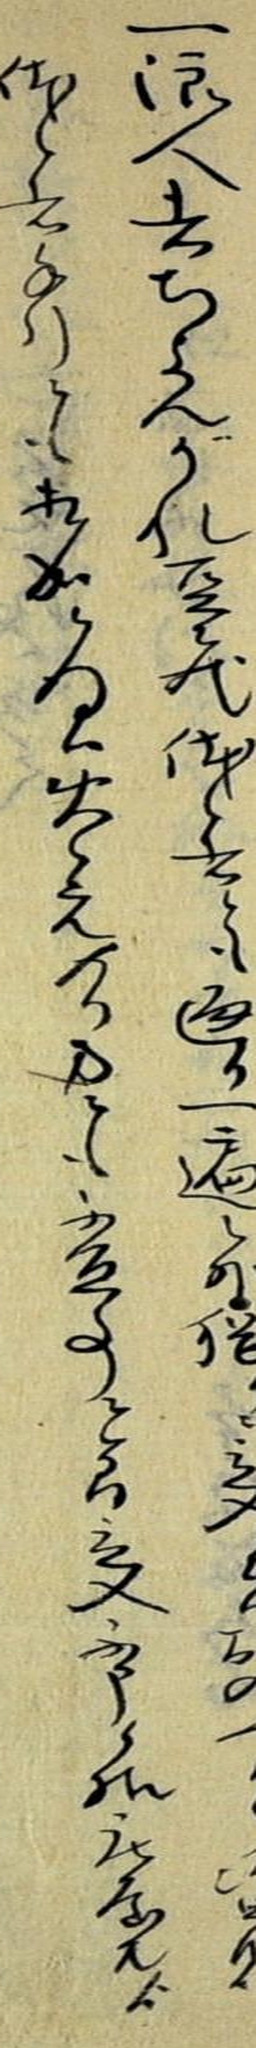体之者手引にも相成候得は火之元〆り方にも不宜事に候間立入不申候様庄屋共ゟ
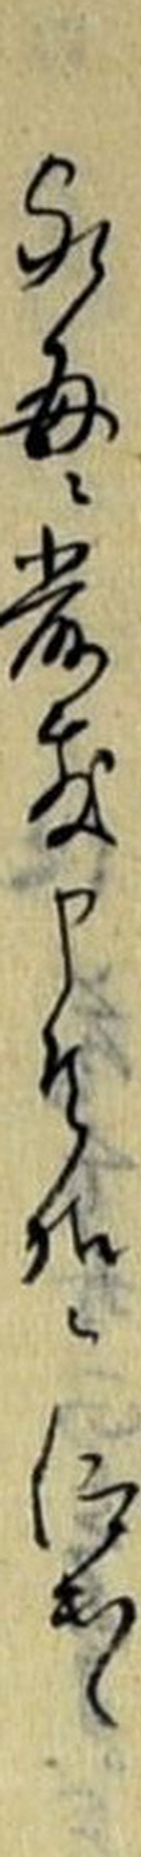家毎に厳敷申付候様に被仰出候
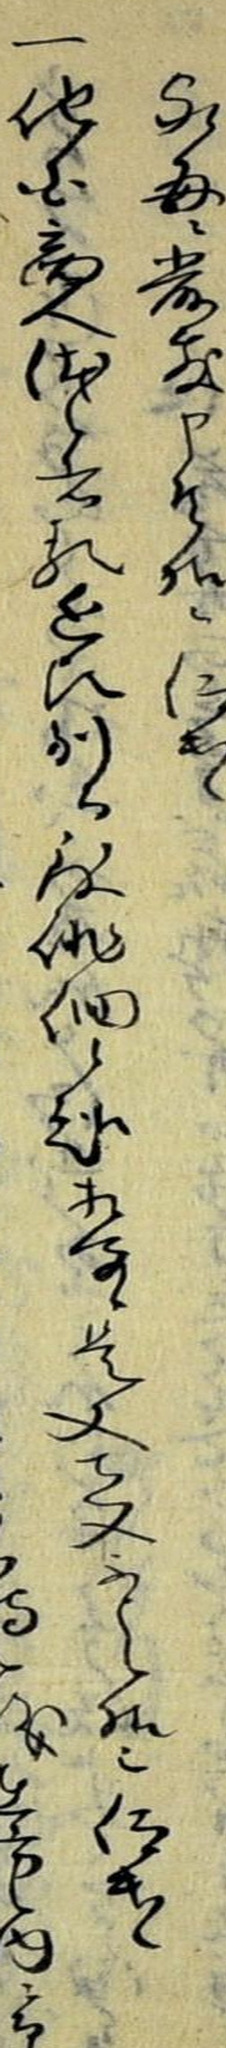一他国商人体之者類近頃別而致徘徊之趣相聞候是又立入不申候様被仰遣候
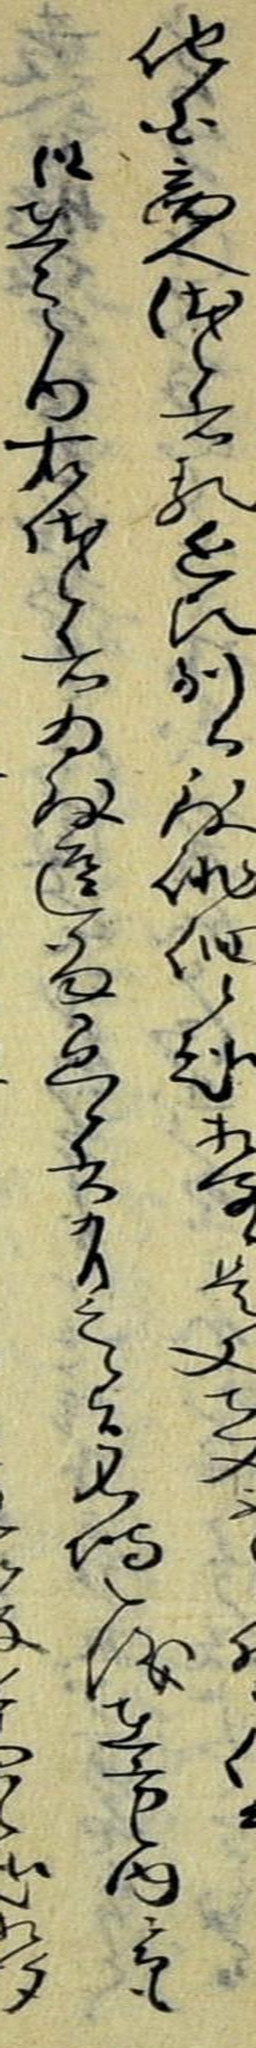但在々之内右体之者為致逗留置候者有之候旨不埒之儀在方之内に而も
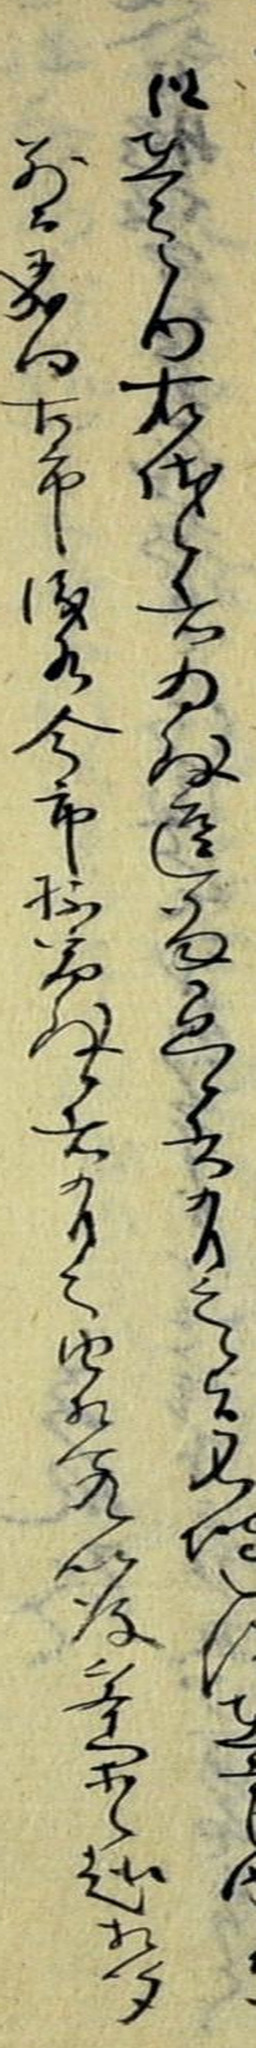別而森田古市浅水今市抔宿致候者有之候由相聞以後等閑之趣相聞
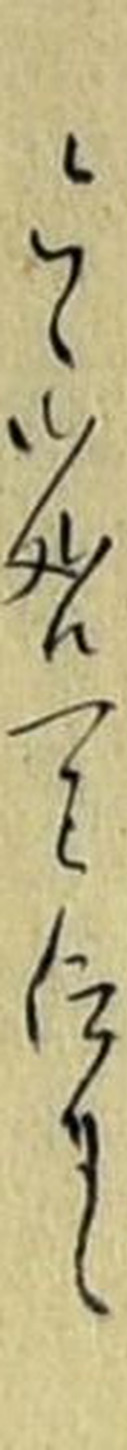候はヽ御咎可被仰付候
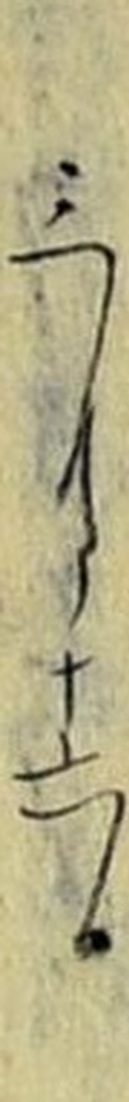三月十六日
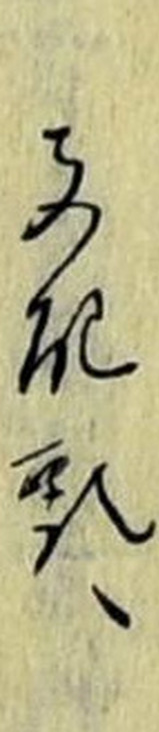支配頭へ
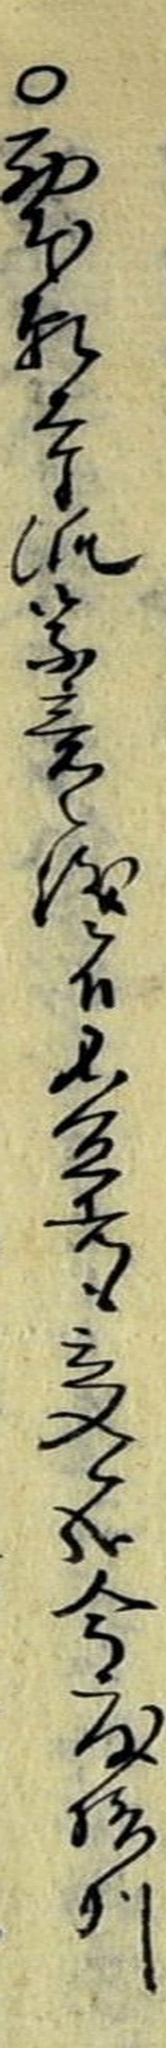○西本願寺派宗意之儀に付不宜者も立入候哉今度格別
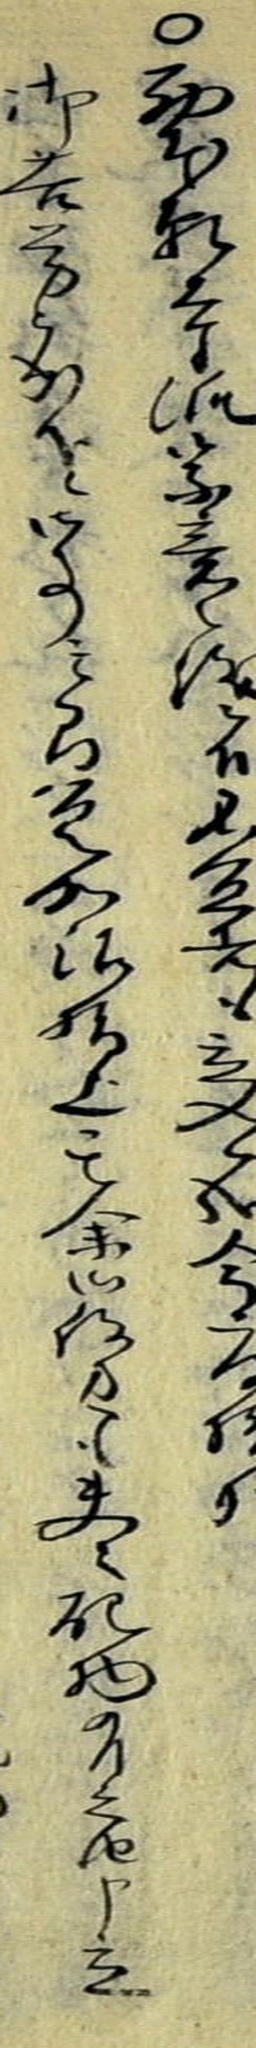御苦労被成下候御事に候間冥加銀指上其余御役方へも夫々配物有之由申立
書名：命令之部 四
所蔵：福井県文書館 Fukui Prefectural Archives
